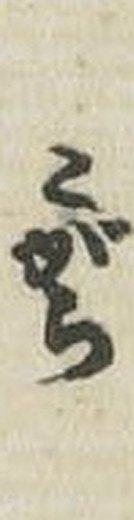こがら
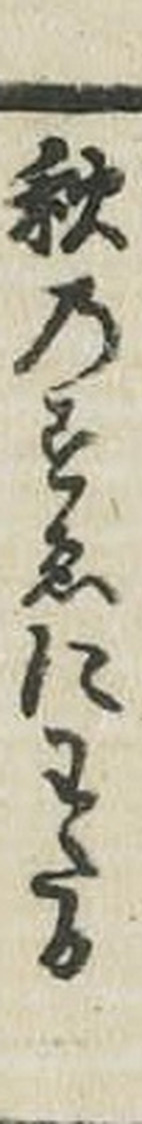秋のすゑにわたる
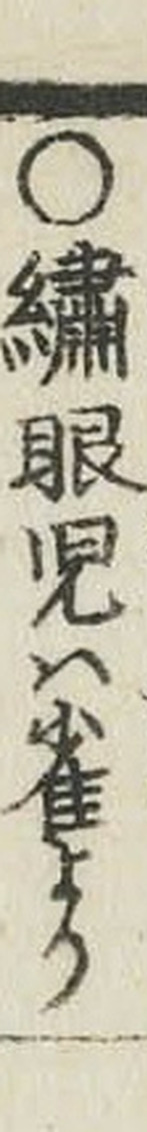○繍眼児は雀より
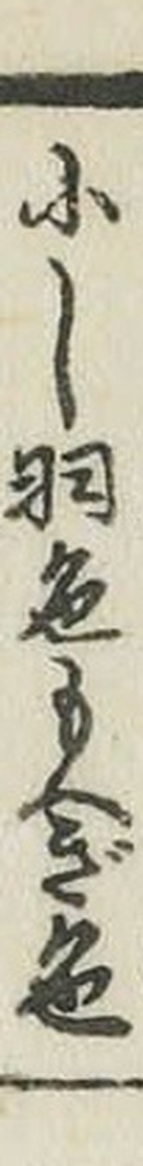小し羽色もへぎ色
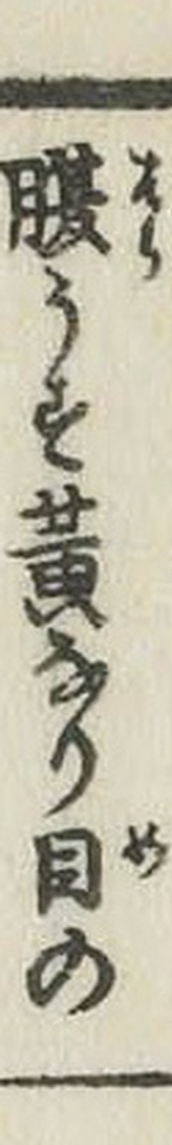腹うす黄なり目の
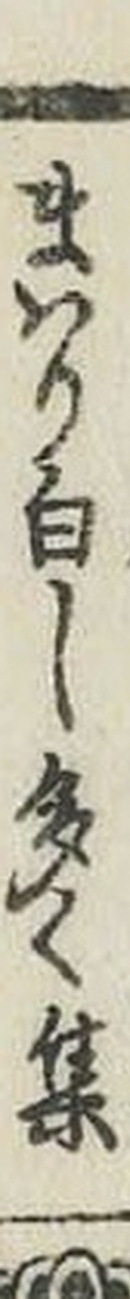まはり白し多く集
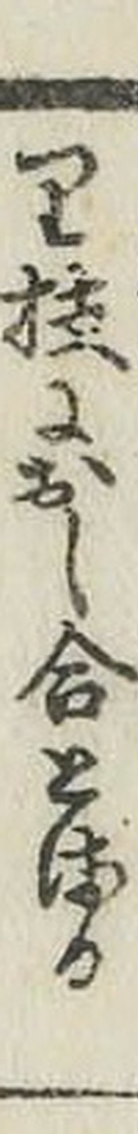り枝におし合とまる
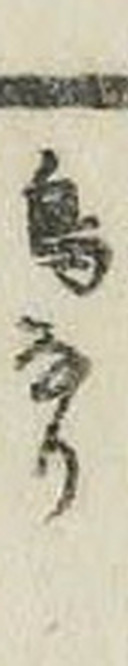鳥なり
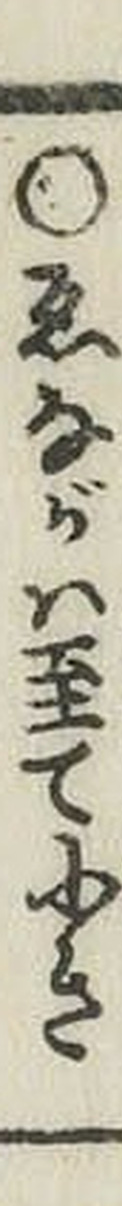○ゑながは至て小き
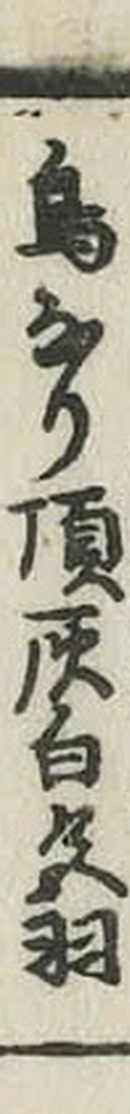鳥なり頂灰白色羽
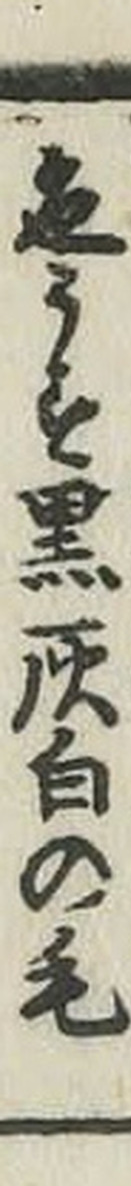色うす黒灰白の毛
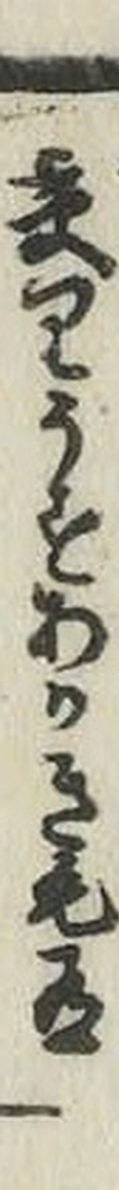交りうすあかき毛有
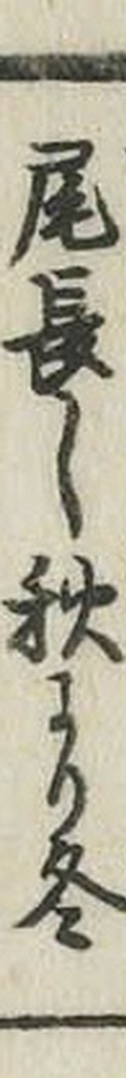尾長し秋より冬
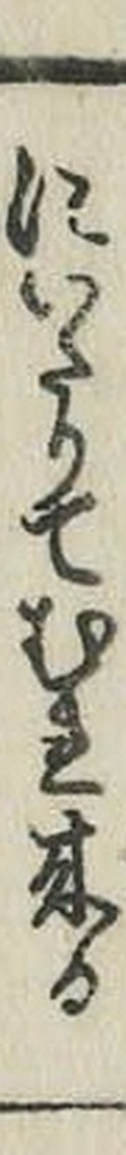にいたりてむれ来る

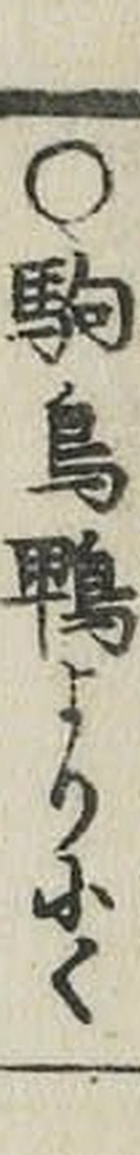○駒鳥鵯より小く
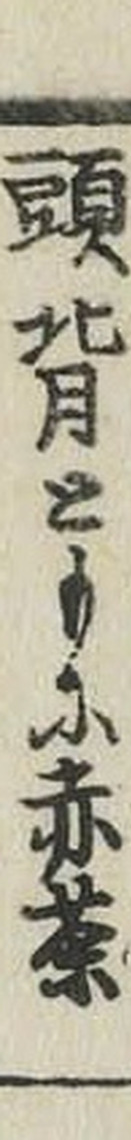頭背ともに赤茶
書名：増補頭書訓蒙図彙大成 10巻 6:巻之12-13
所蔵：東京学芸大学教育コンテンツアーカイブ
